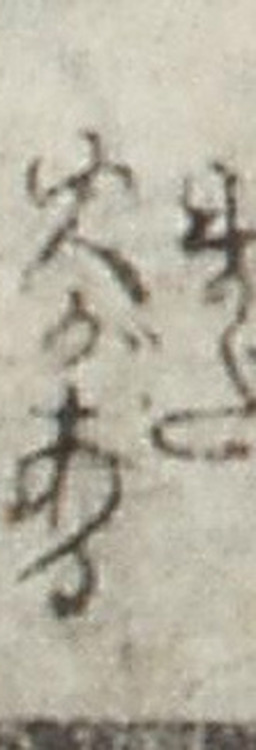火がある
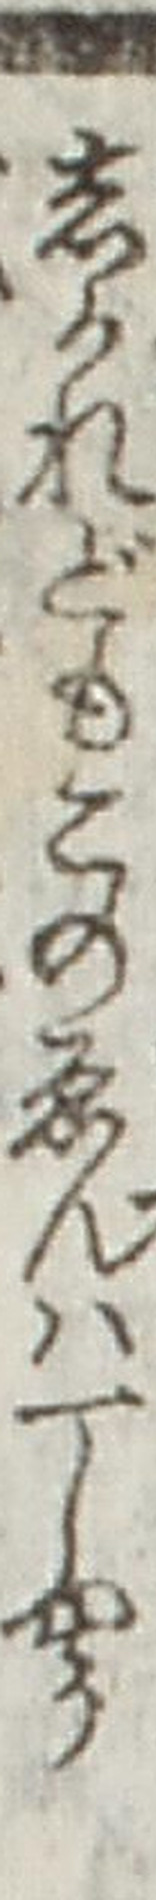しかれどもこのゑんは一しやう
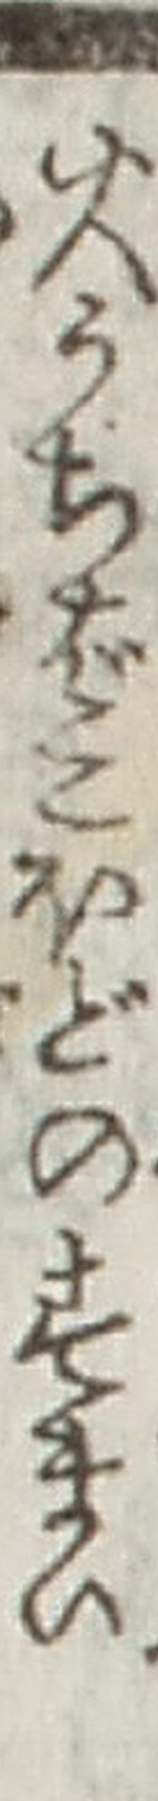火うちばこほどのすまい
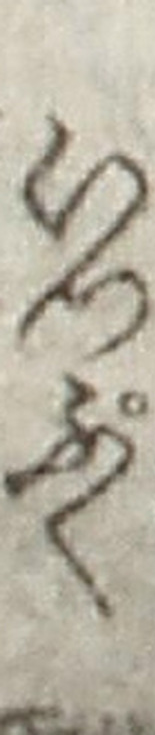いつぷく
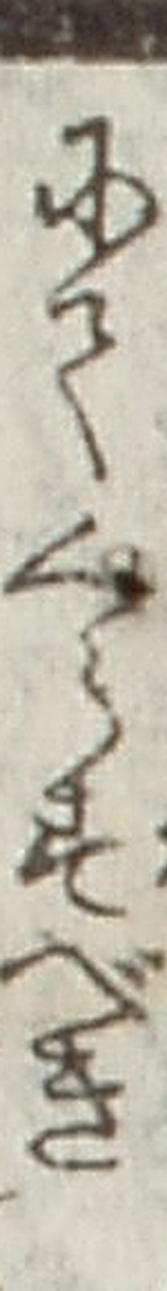にてくらすべき
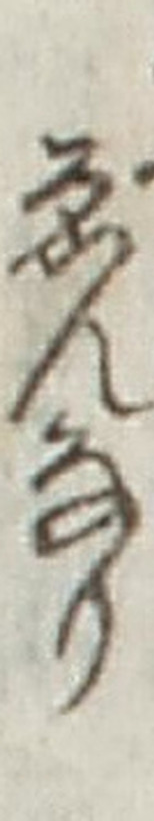ゑんなり
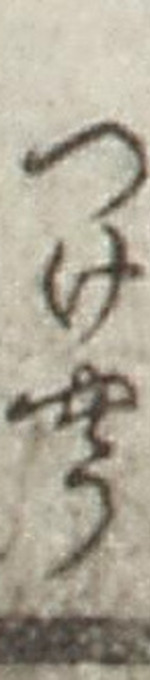つけやう
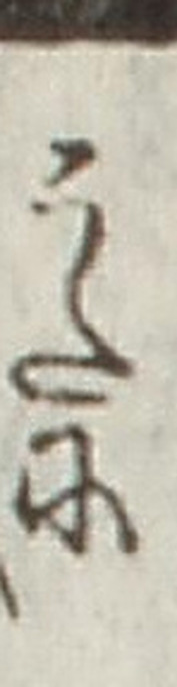うたに
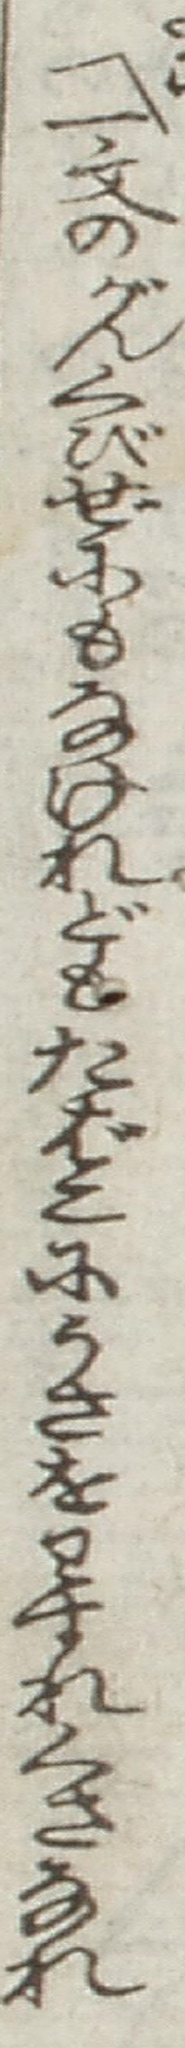〽一文のがんくびぜにもなれどもたばこにうさをわすれくさなれ

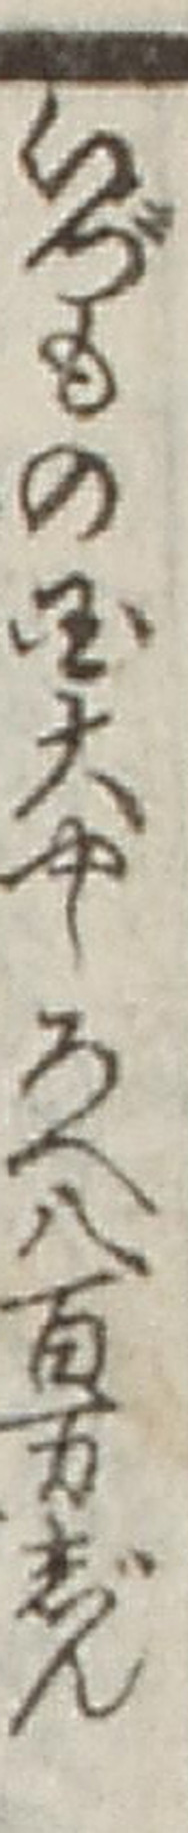いづもの國大やしろへ八百万じん
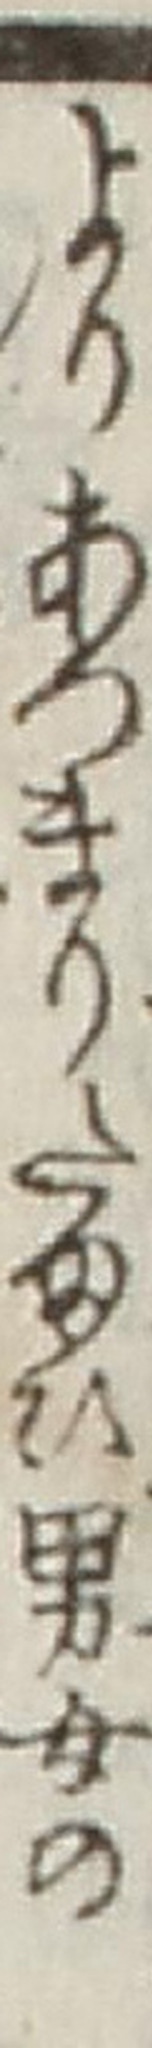よりあつまりたまひ男女の
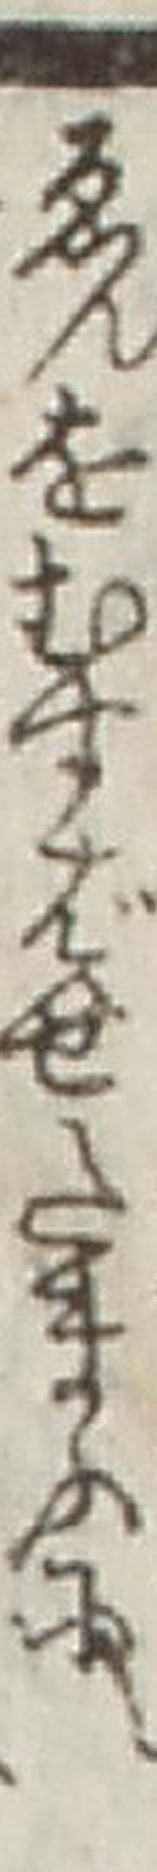ゑんをむすばせたまふに
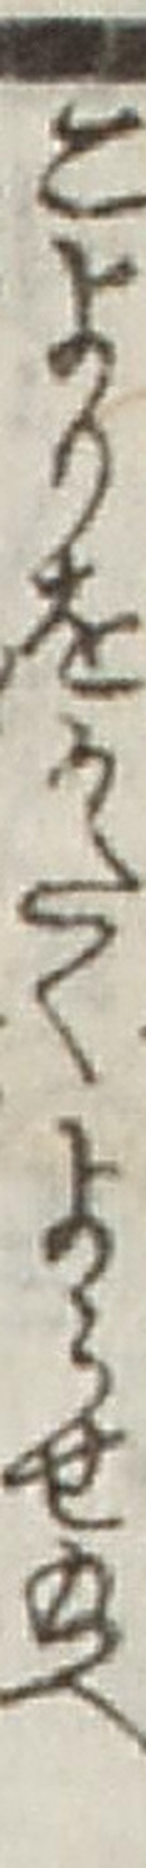こよりをかたくよらせ玉へ
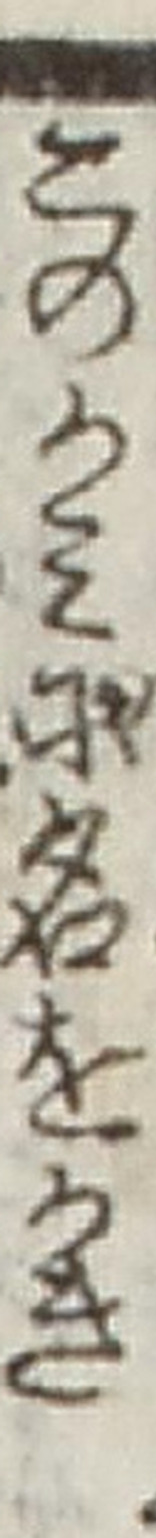このかミに名をかき
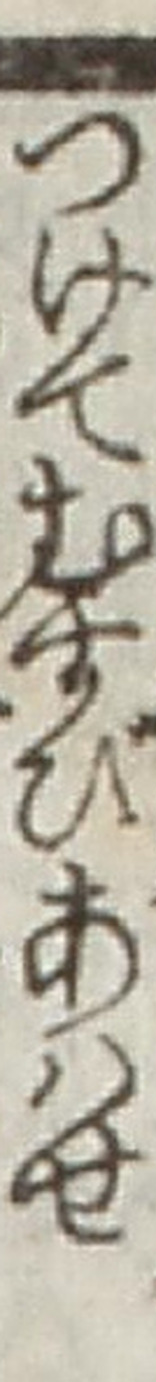つけてむすびあハせ
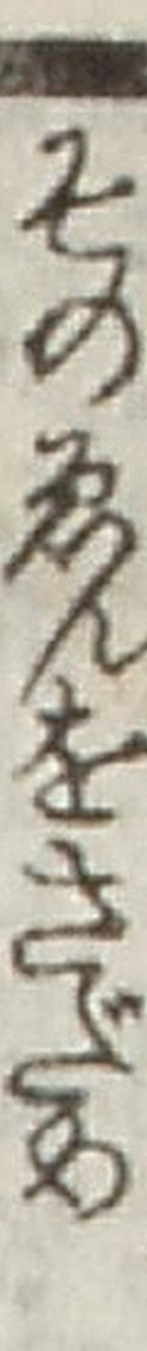そのゑんをさだめ
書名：三世相出雲當座帳　上下冊
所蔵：東京大学地震研究所図書室 Earthquake Research Institute Library, The University of Tokyo, JAPAN
